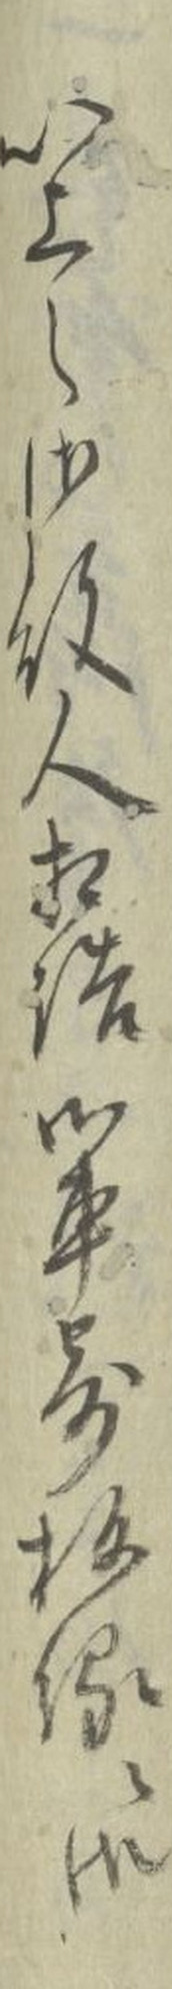以上之御役人相詰御車寄板縁に御
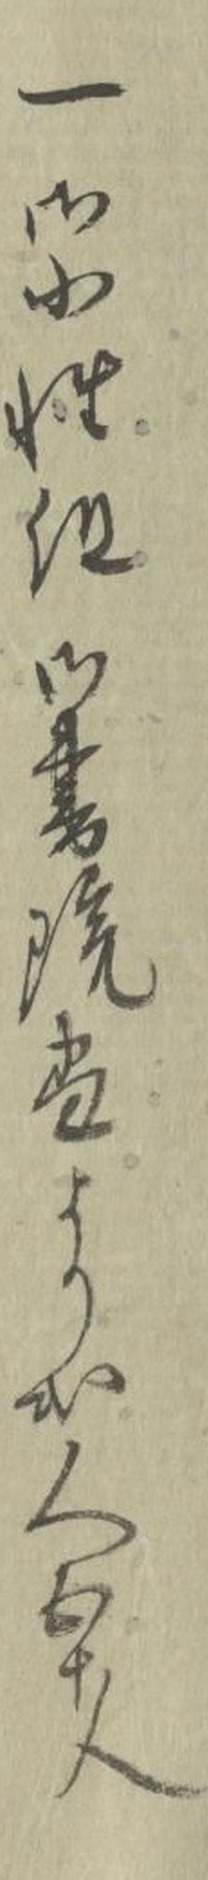一御小性組御書院番より出人五十人
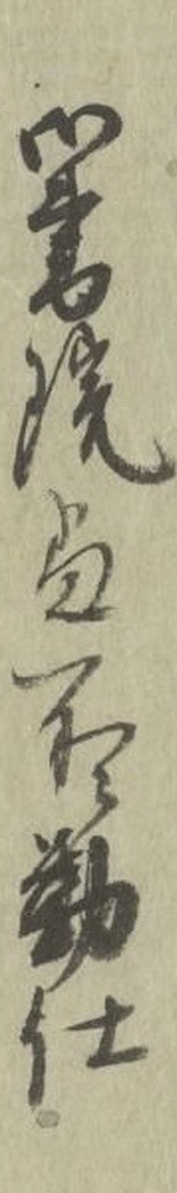御書院番所々勤仕
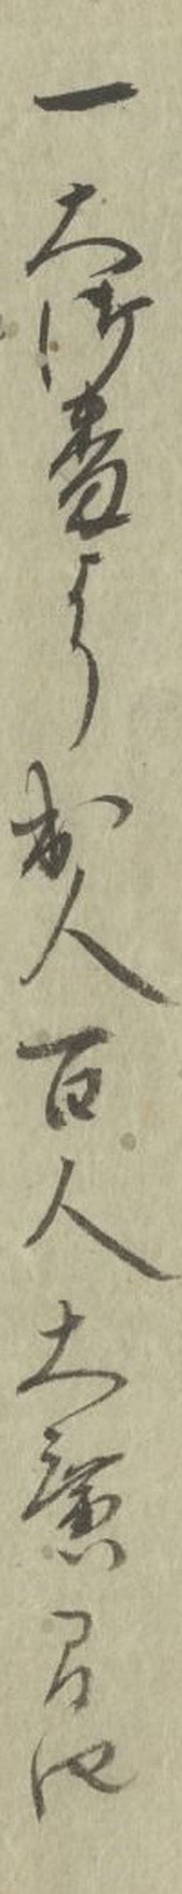一大御番より出人百人大広間四
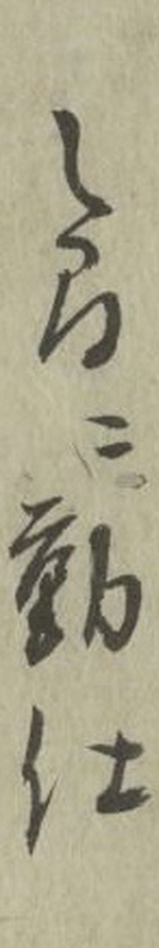之間に勤仕

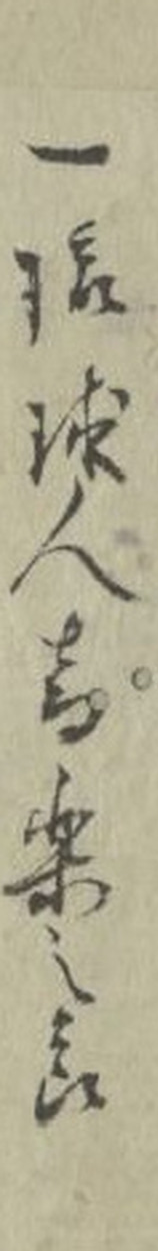一琉球人音楽之節
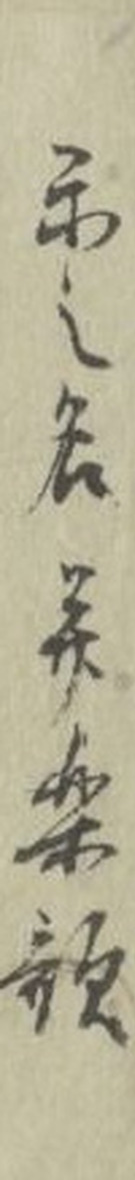楽之名幷楽歌
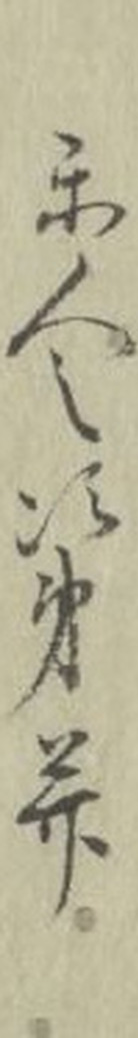楽人之次第幷
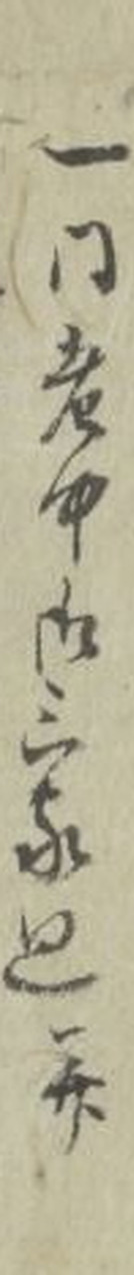一同老中御三家廻幷
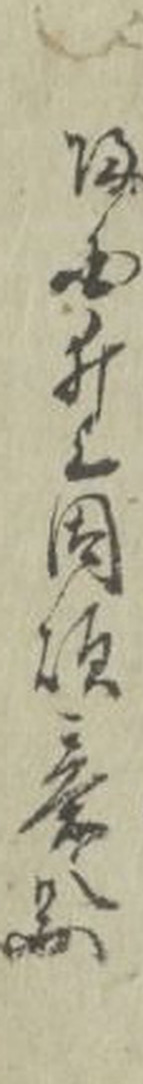帰国井上因硯碁之図

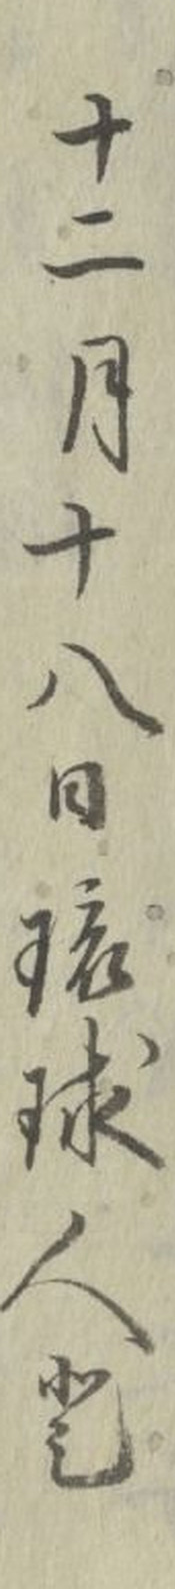十二月十八日琉球人登
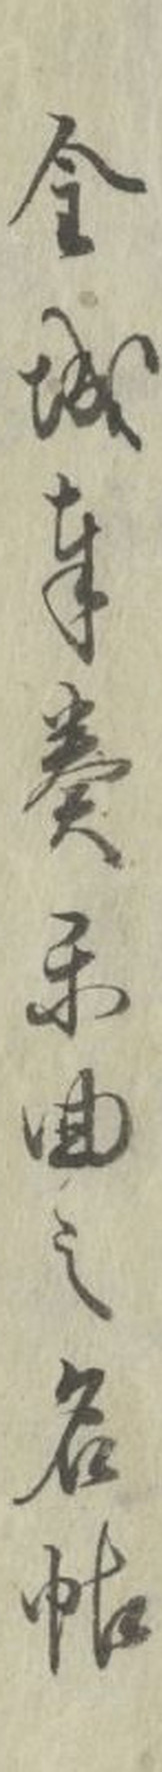金城奉奏楽曲之名帳
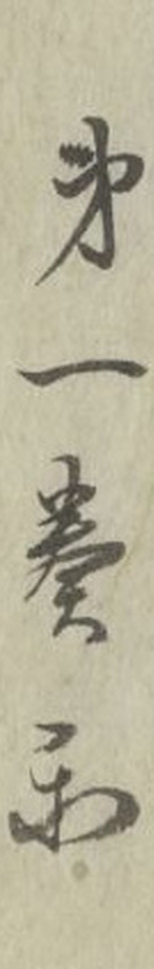第一奏楽
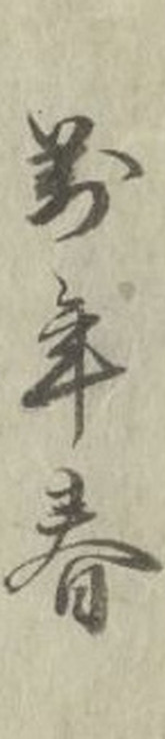万年春
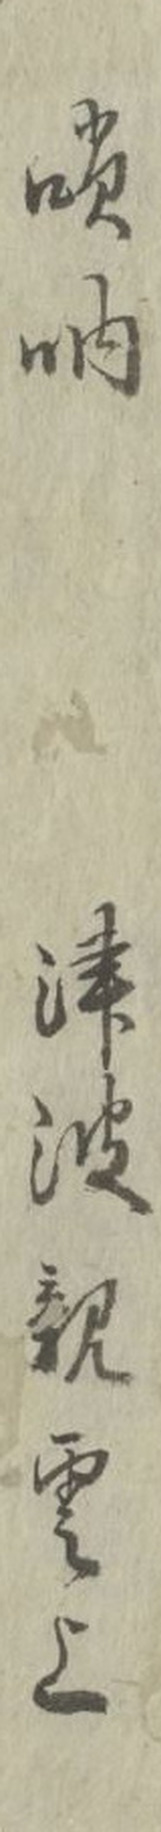嗩吶津波親雲上

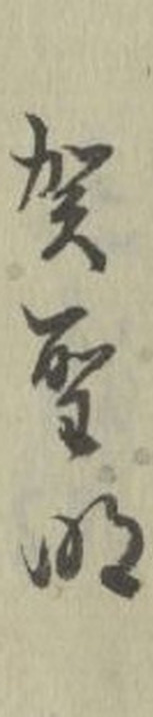賀聖明
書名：琉球来朝記 自八至十四終
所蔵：University of the Ryukyus Library
